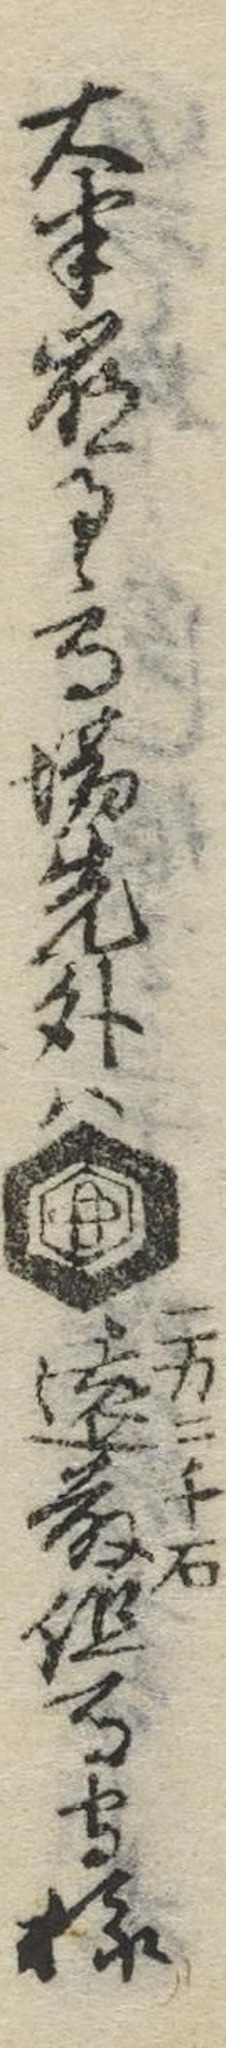大半崩るゝ馬場先外ハ遠藤但馬守様
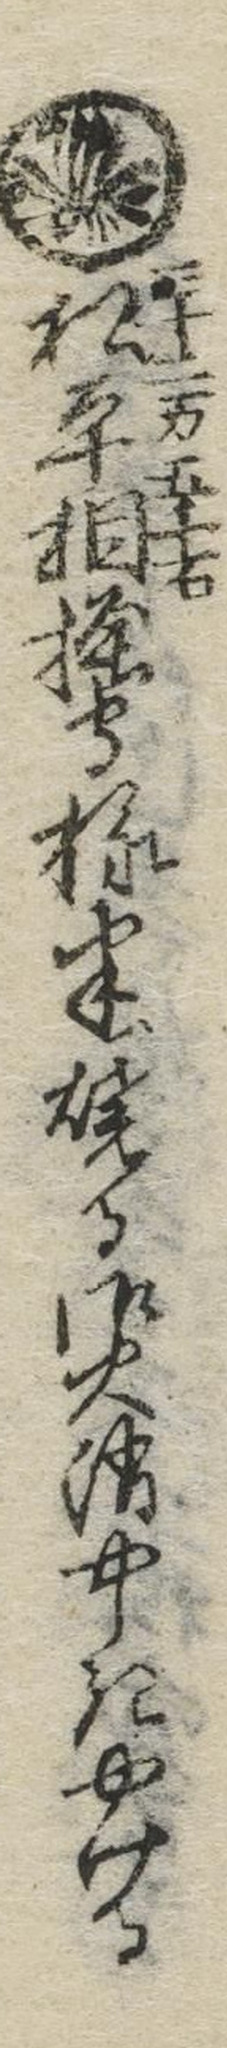松平相模守様半焼る御火消やしきやける
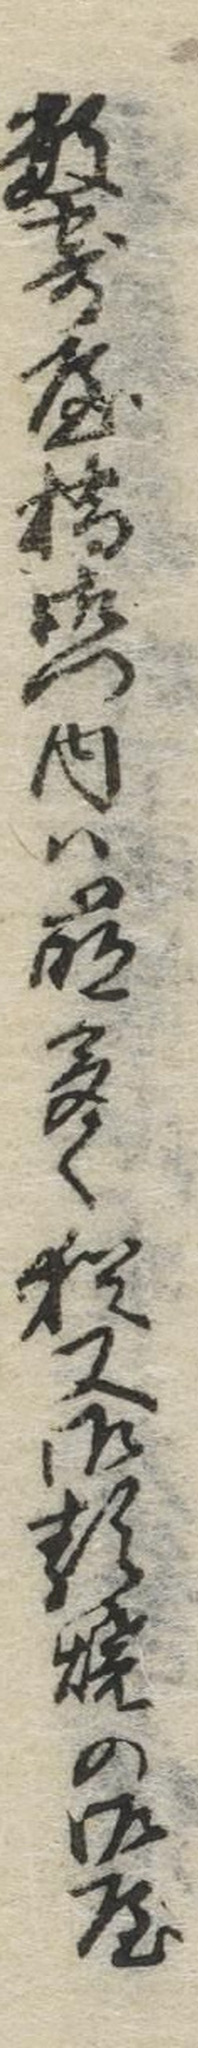数寄屋橋御門内ハ崩多く猶又御類焼の御屋
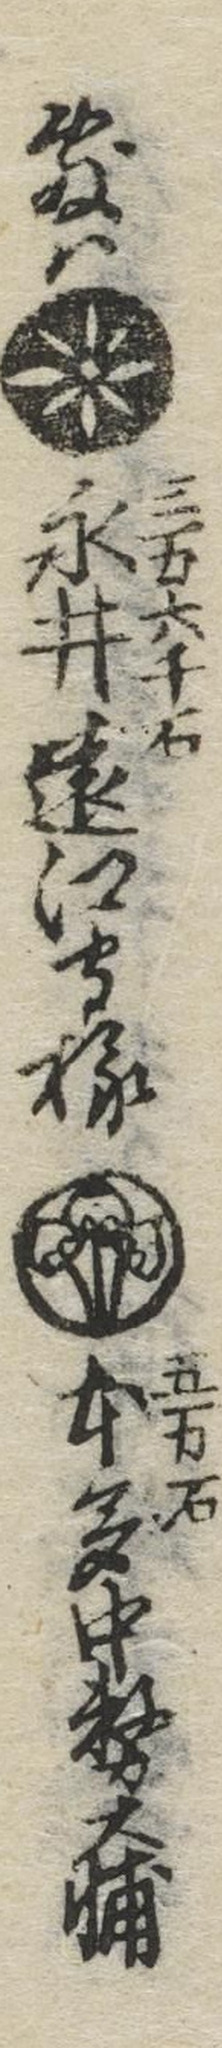敷ハ永井遠江守様本多中務大輔
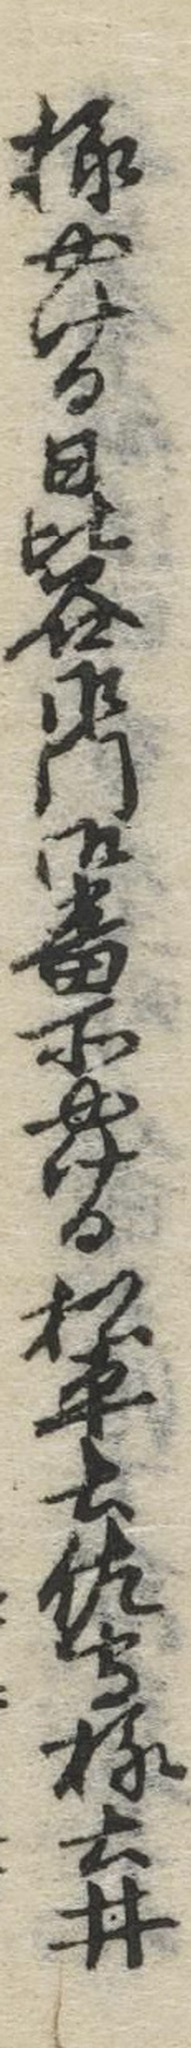様やける日比谷御門御番所やける松平土佐守様土井
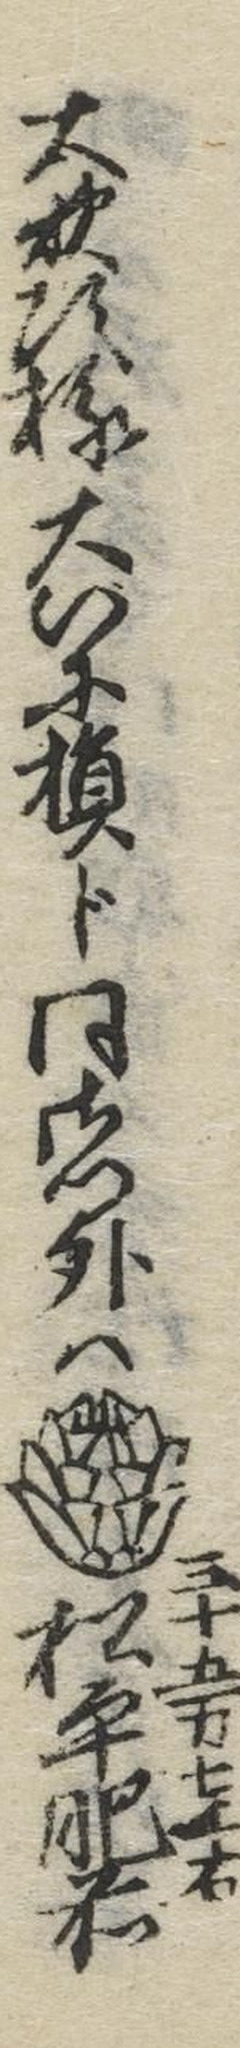大炊頭様大いニ損じ同御門外ハ松平肥前
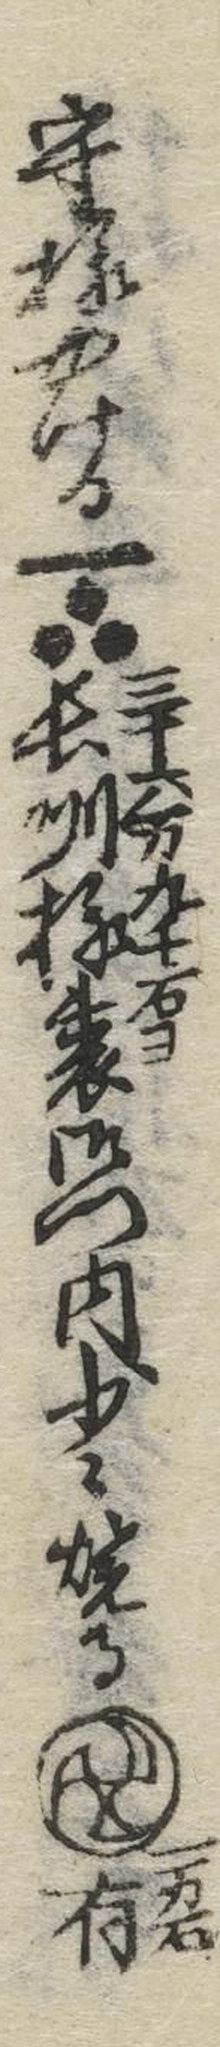守様やける長州様裏御門内少〻焼る有
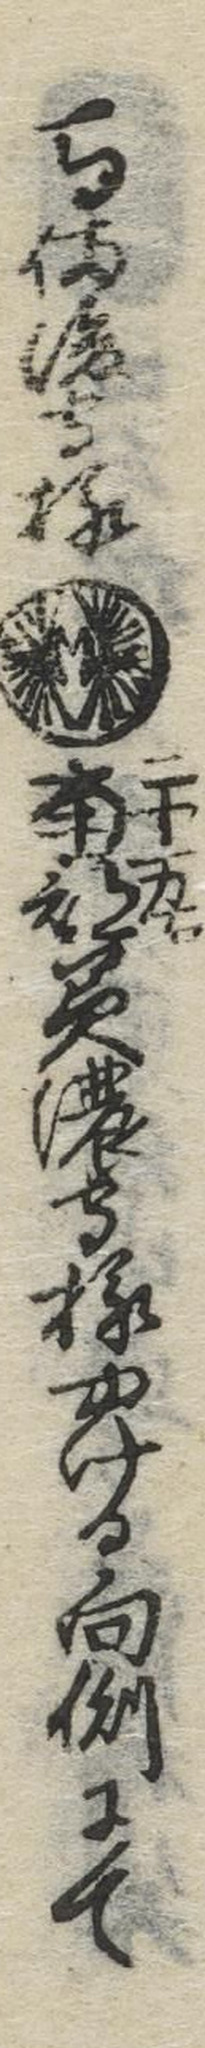馬備後守様南部美濃守様やける向側にて
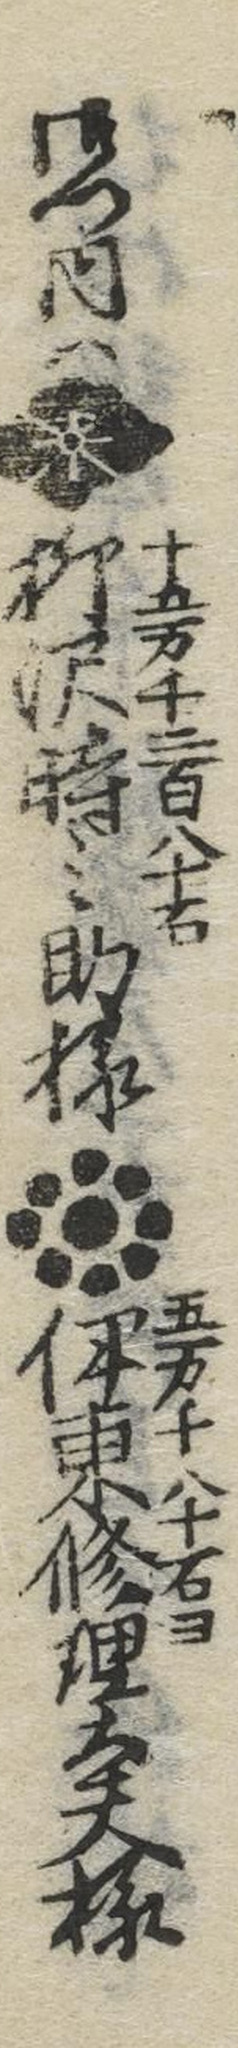御門内ハ柳沢時之助様伊東修理大夫様
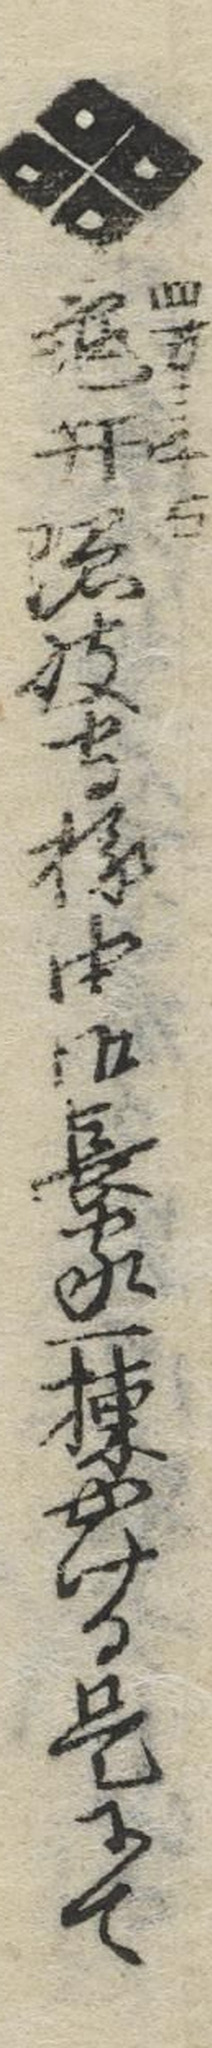亀井隠岐守様中御長家一棟やける是にて
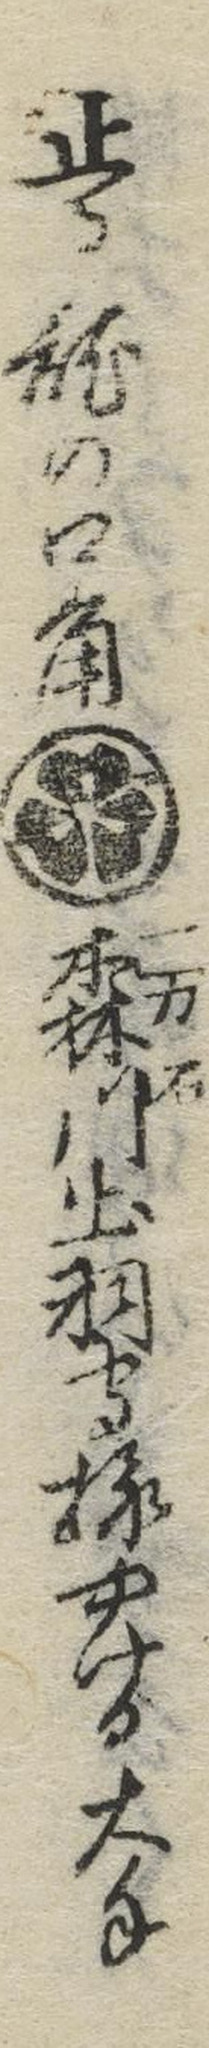止る龍の口角森川出羽守様やける大手
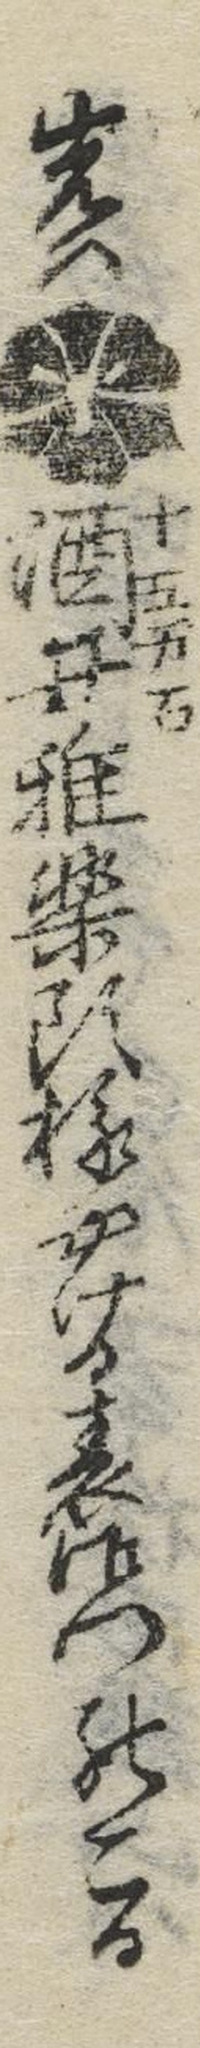先ハ酒井雅樂頭様やける表御門のこる
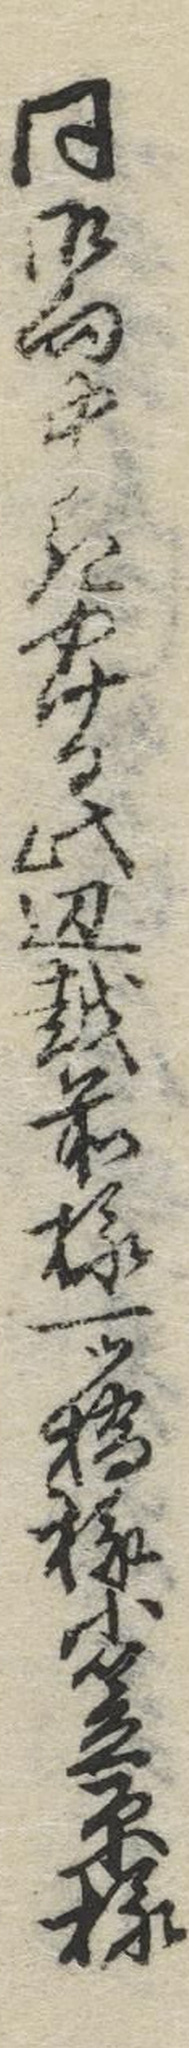同御向やしきやける此辺越前様一ツ橋様小笠原様
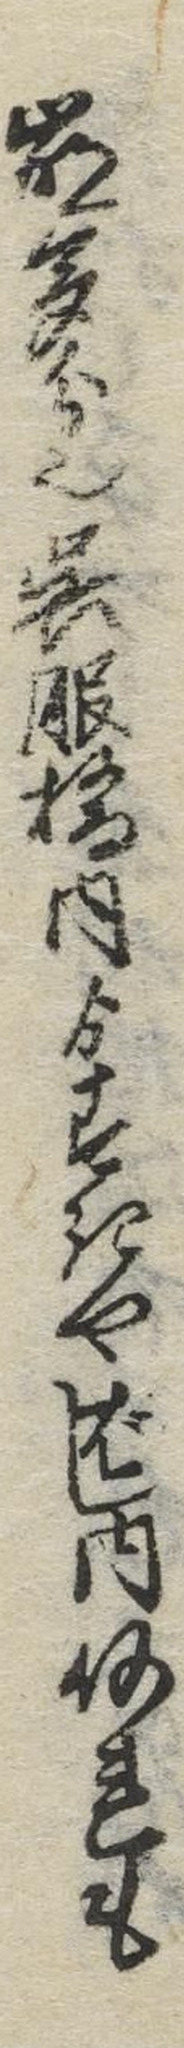崩多分也呉服橋内ゟすきやばし内何れも
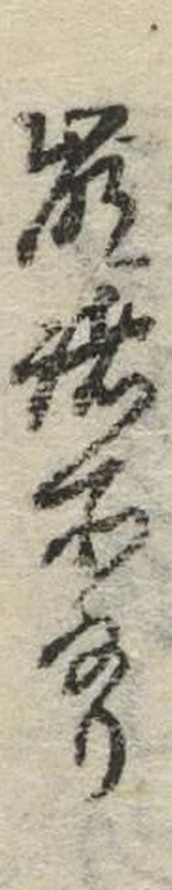崩諸所なり
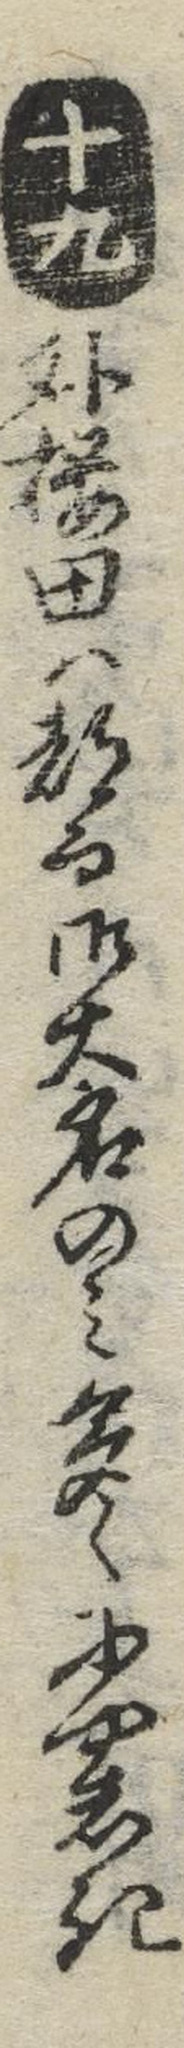十九外桜田ハ都而御大名のミ多く小やしき
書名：江戸御屋鋪方町方共　地震類焼場所巨細書之寫　潰家潰土蔵共取調附街道筋近在迄
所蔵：東京大学地震研究所図書室 Earthquake Research Institute Library, The University of Tokyo, JAPAN
